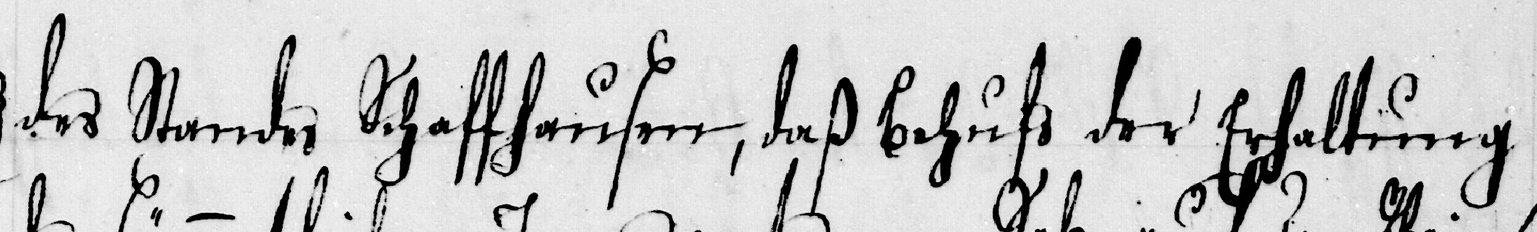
des Standes Schaffhausen, daß behufs der Erhaltung
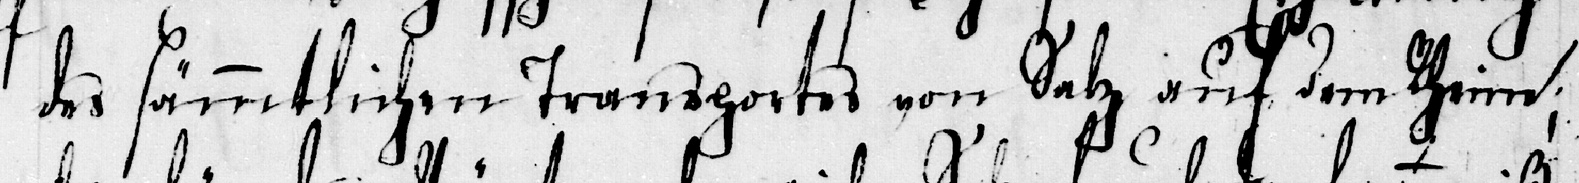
des sämmtlichen Transportes von Salz auf dem Rhein,
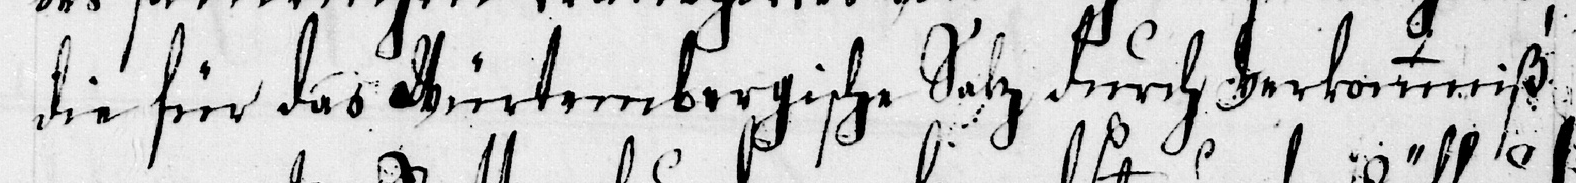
die für das Würtembergische Salz durch Verkommniß
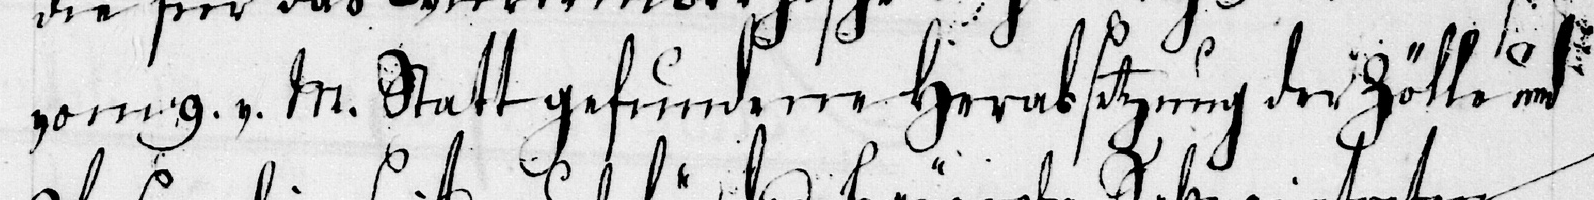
vom 9. v. M. Statt gefundene Herabsetzung der Zölle und
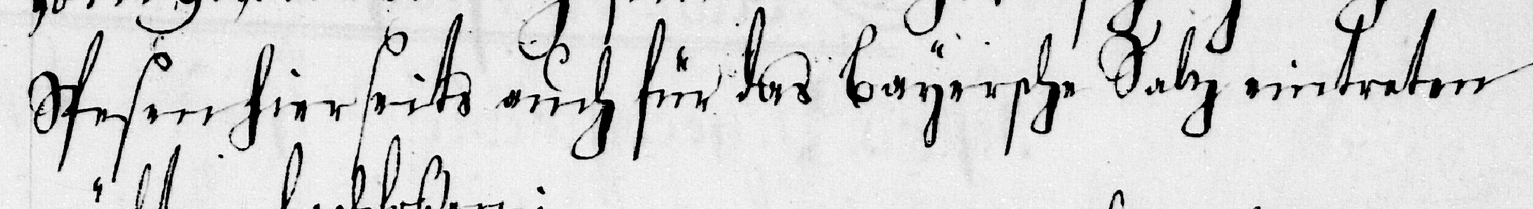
Spesen hierseits auch für das Bayersche Salz eintreten
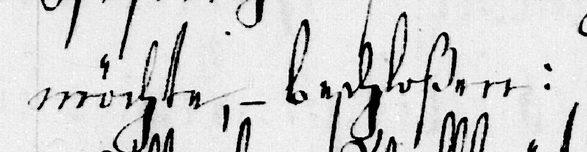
möchte, – beschloßen:
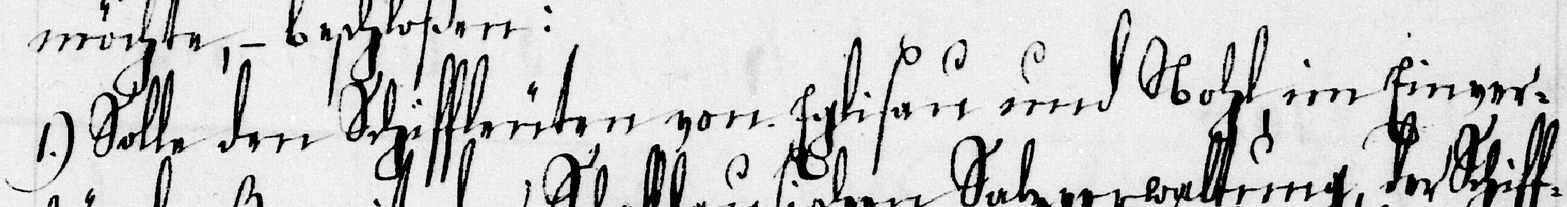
Solle den Schiffleuten von Eglisau und Nohl, im Einver¬
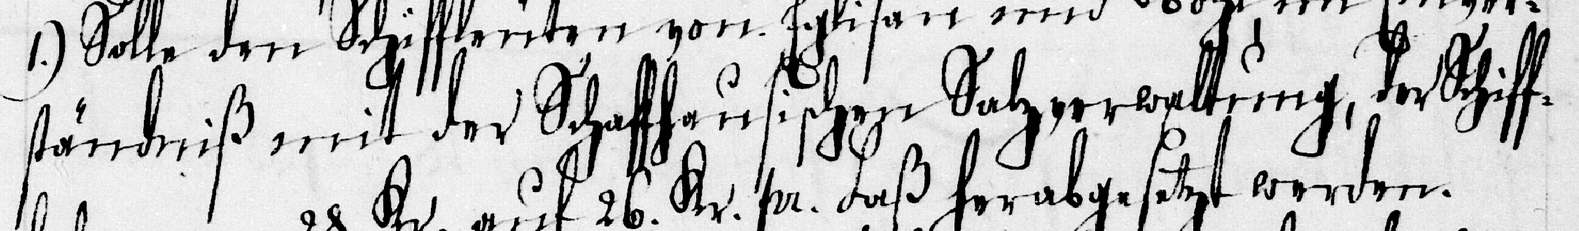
ständniß mit der Schaffhausischen Salzverwaltung, der Schif¬
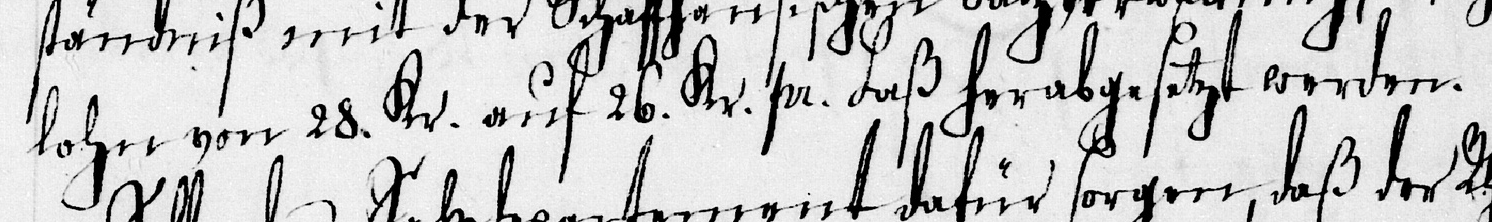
flohn von 28. Kr. auf 26. Kr. pr. Faß herabgesetzt werden.
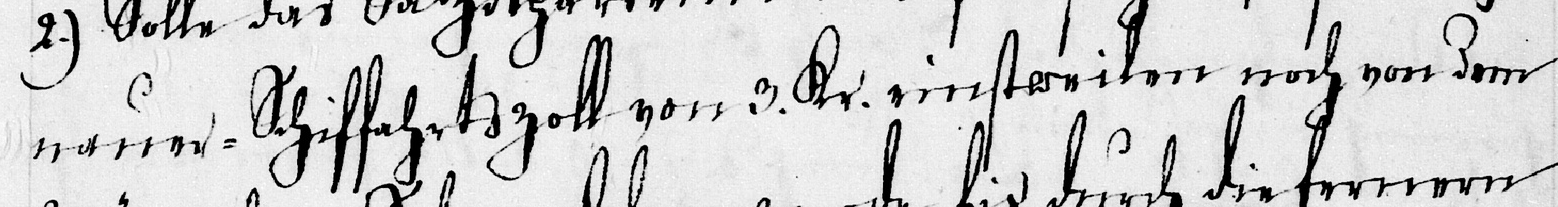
nauer-Schiffahrtszoll von 3. Kr. einstweilen noch von dem
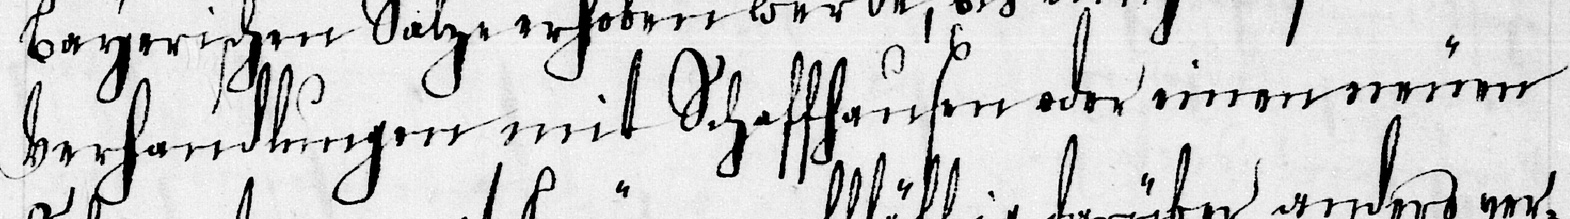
Verhandlungen mit Schaffhausen oder einen neuen
